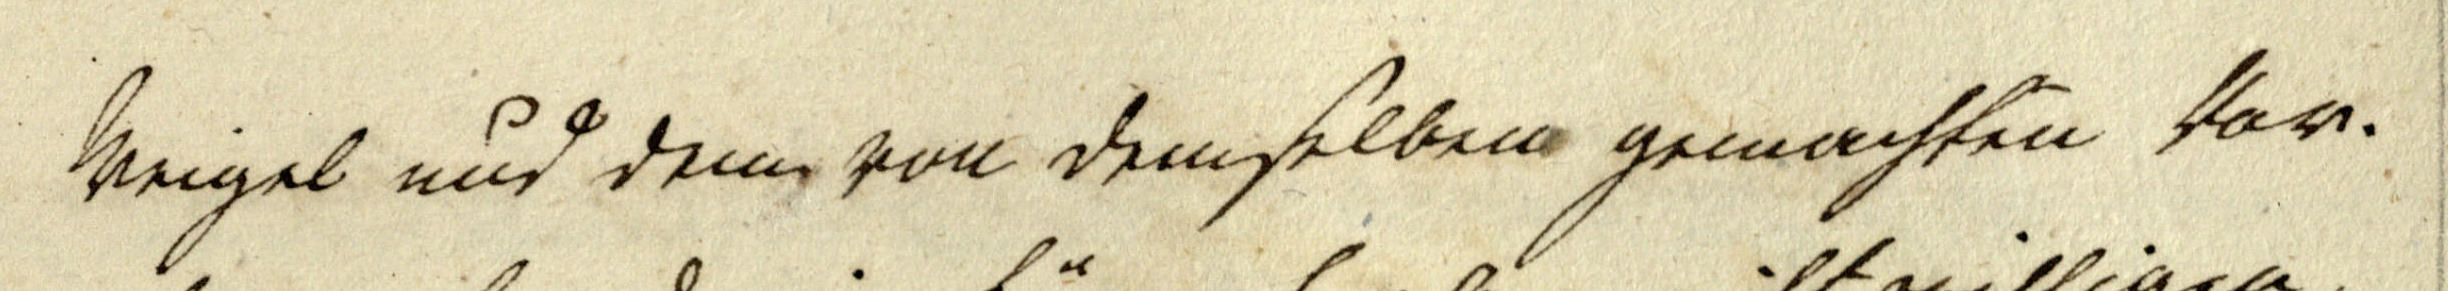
Weigel und dem von demselben gemachten Vor¬
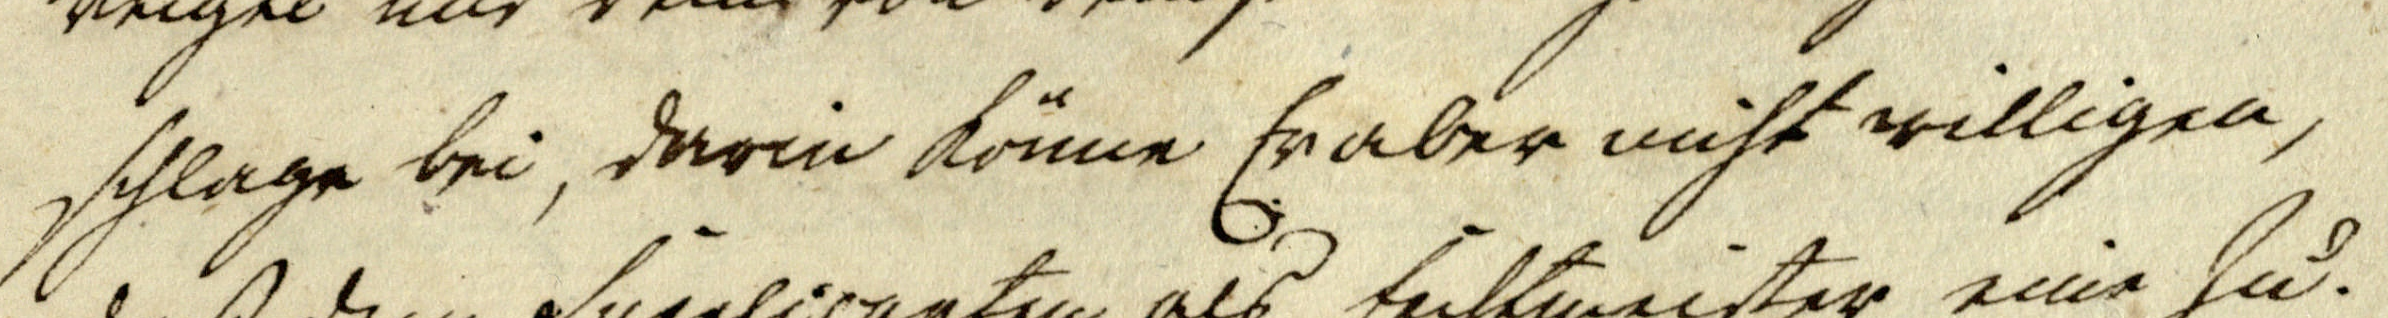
schlage bei, darin könne Er aber nicht willigen,
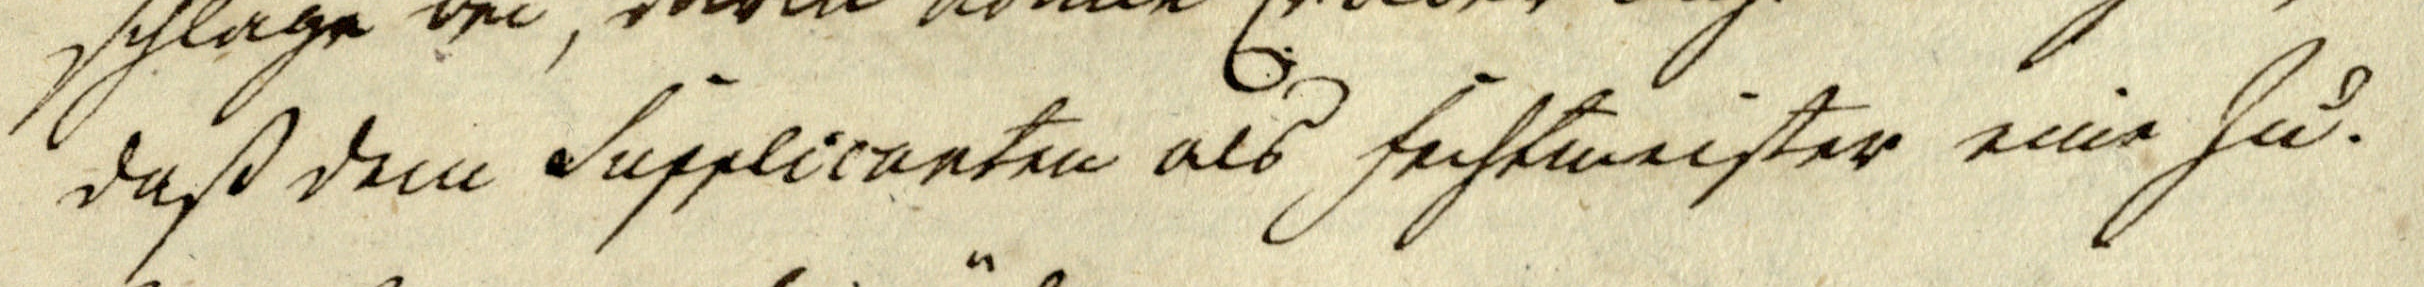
daß dem Supplicanten als Fechtmeister eine Zu¬
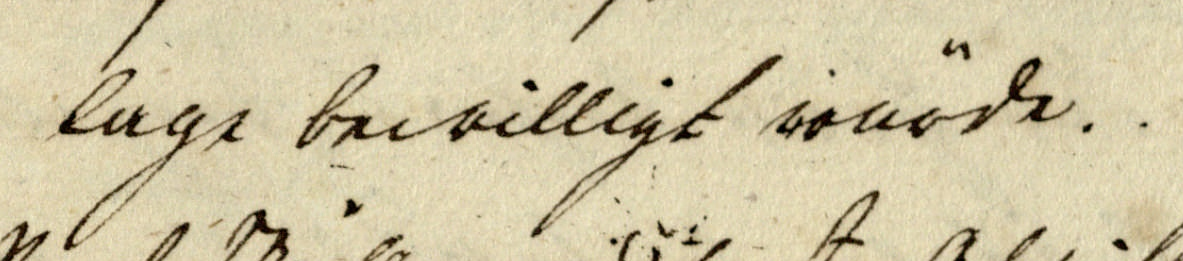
lage bewilligt würde.
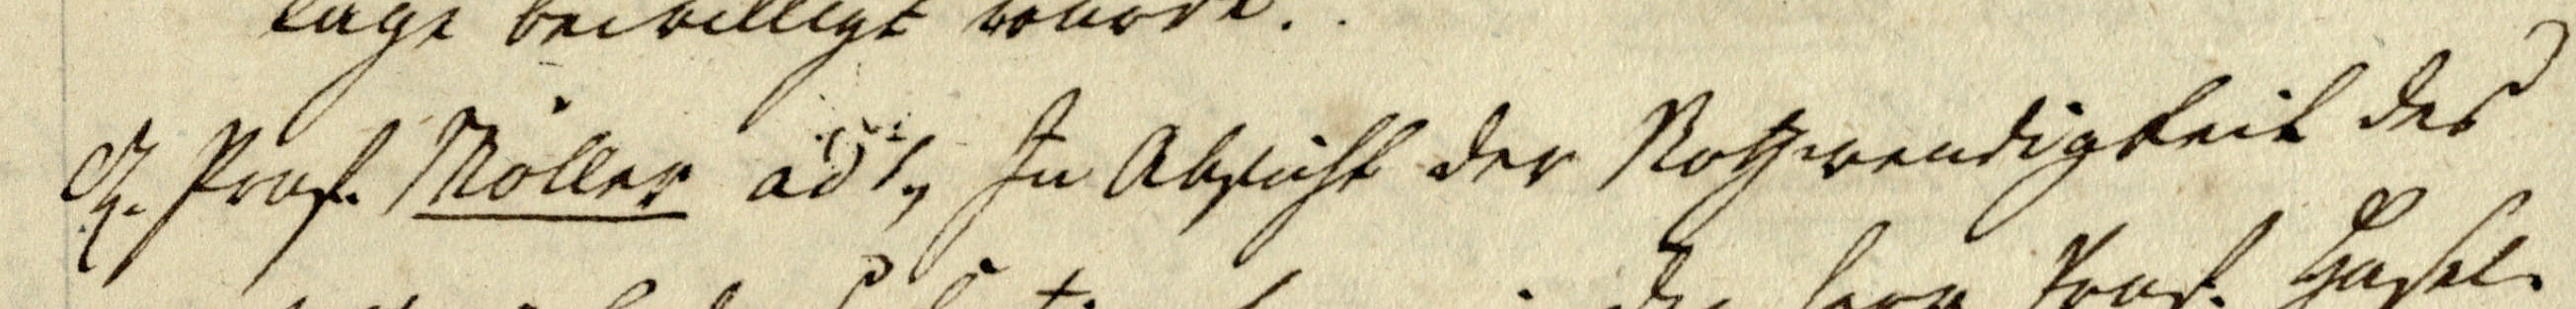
dh. Prof. Möller ad 1., In Absicht der Nothwendigkeit des
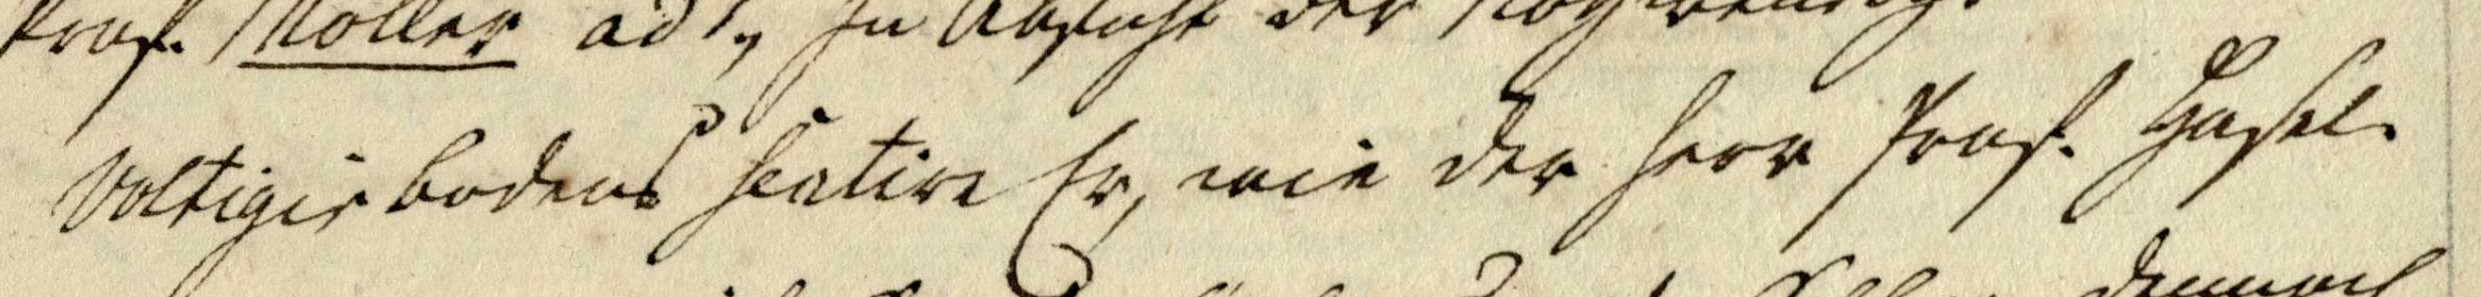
Voltigirbodens sentire Er, wie der Herr Prof. Hasel¬
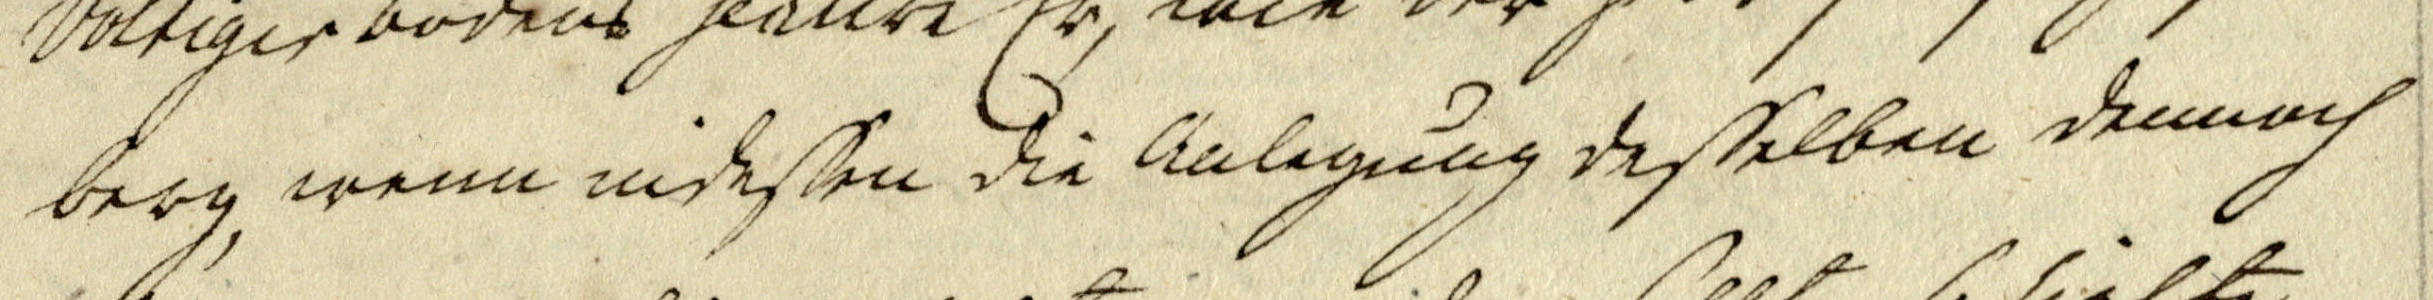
berg, wenn indessen die Anlegung desselben dennoch
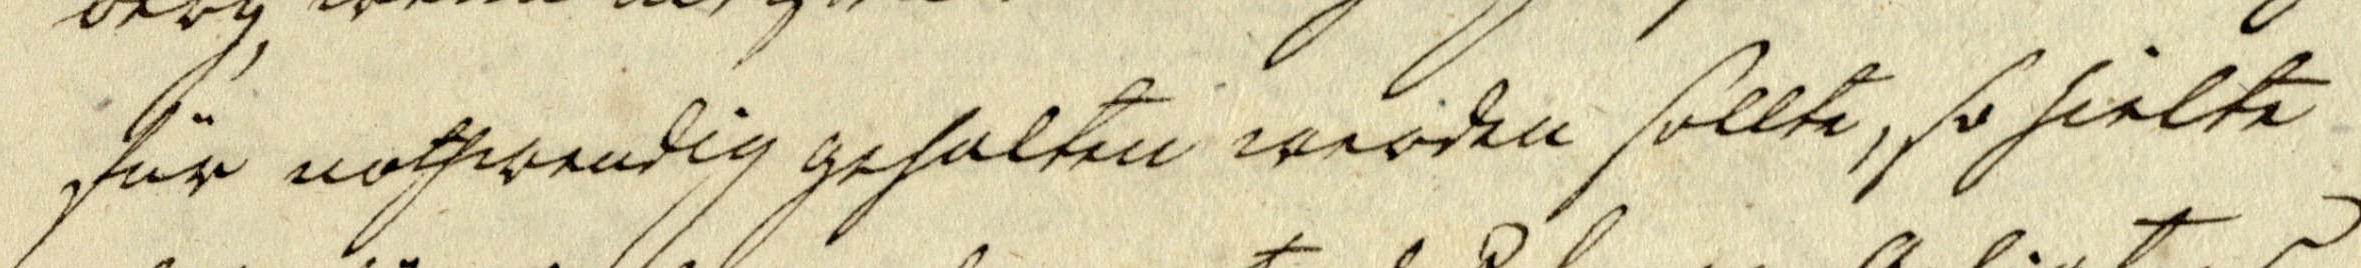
für nothwendig gehalten werden sollte, so hielte
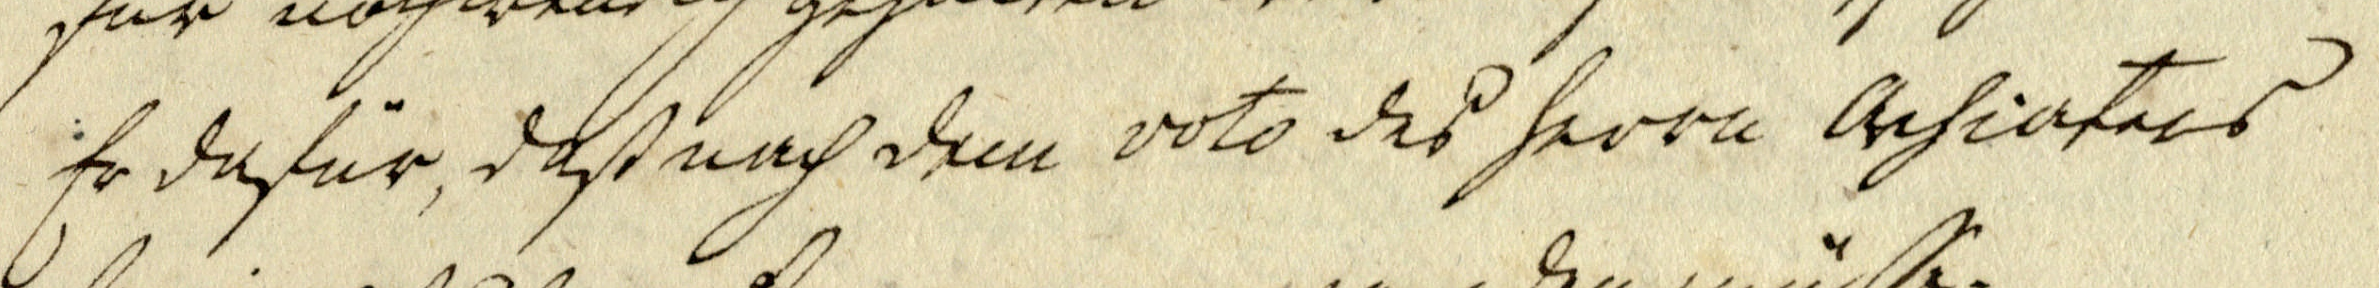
Er dafür, daß nach dem voto des Herrn Archiaters
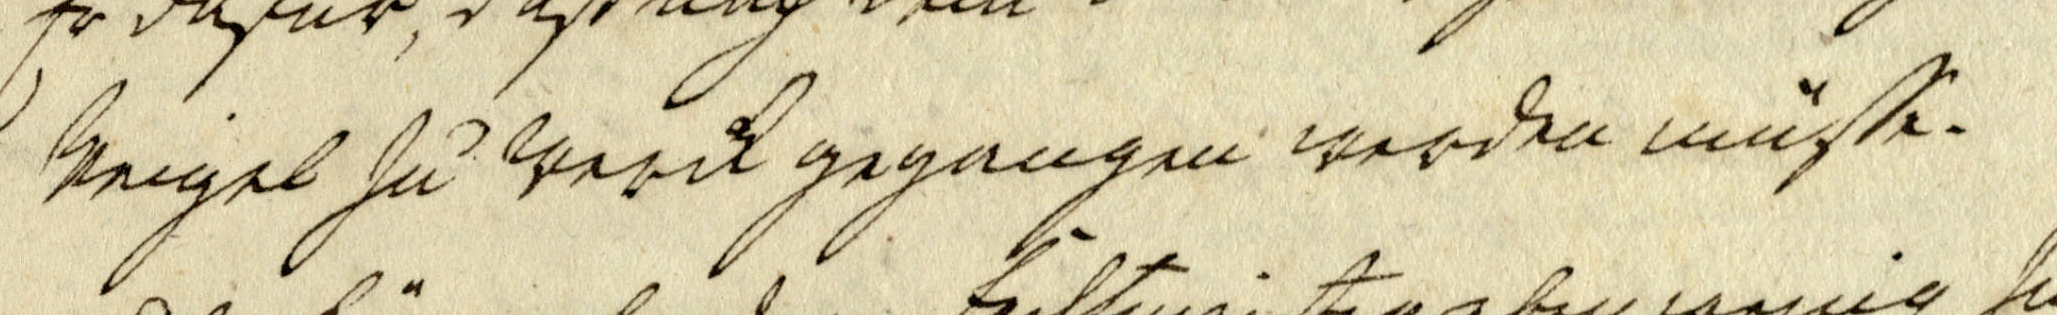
Weigel zu Werck gegangen werden müsse.
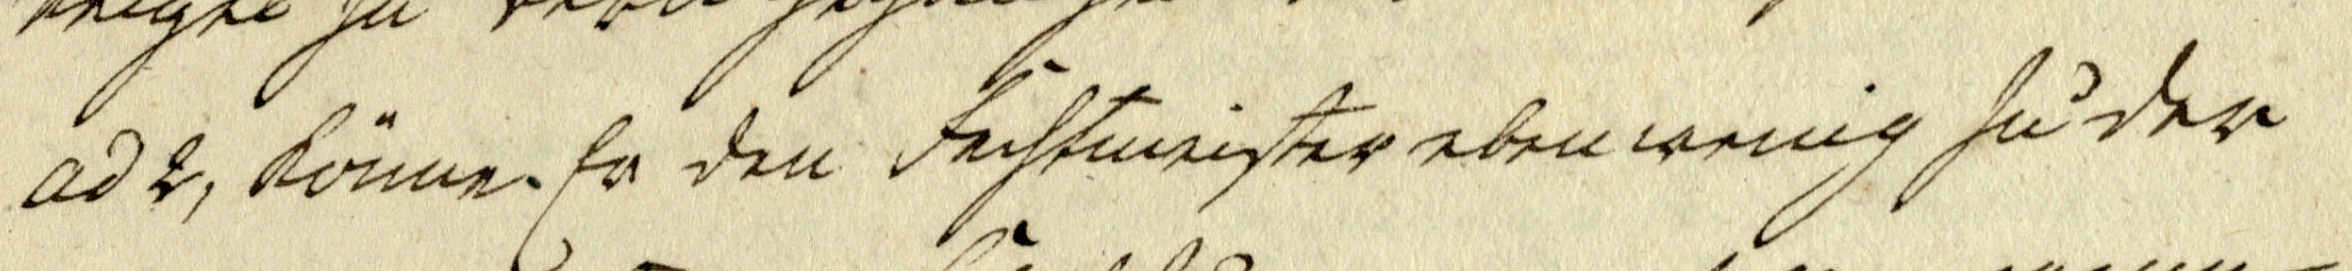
ad 2., könne Er den Fechtmeister eben wenig zu der
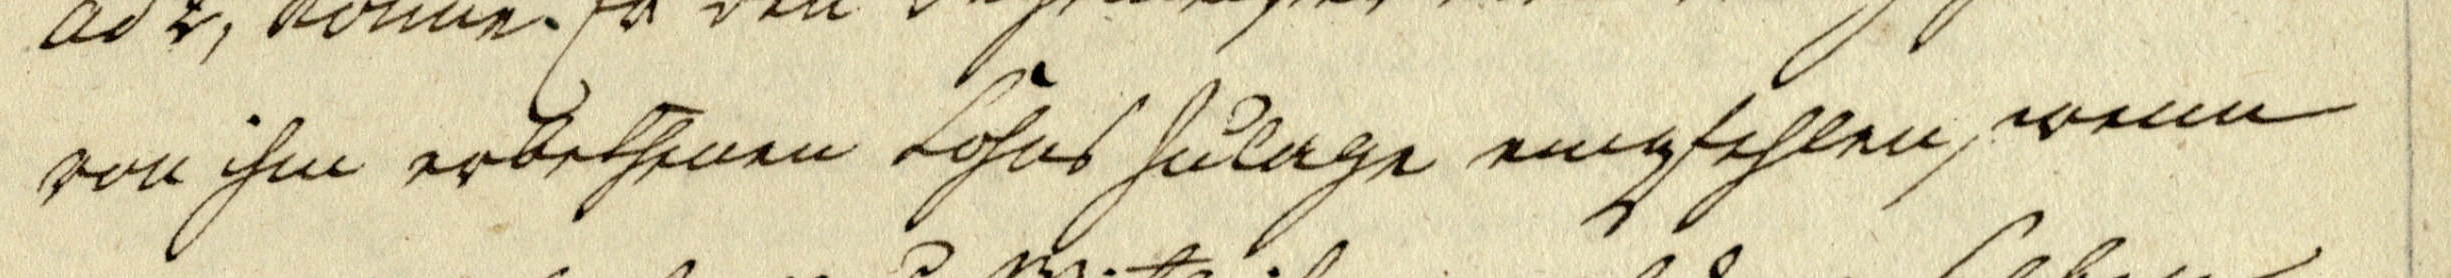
von ihm erbethenen Lohns Zulage empfehlen, wenn
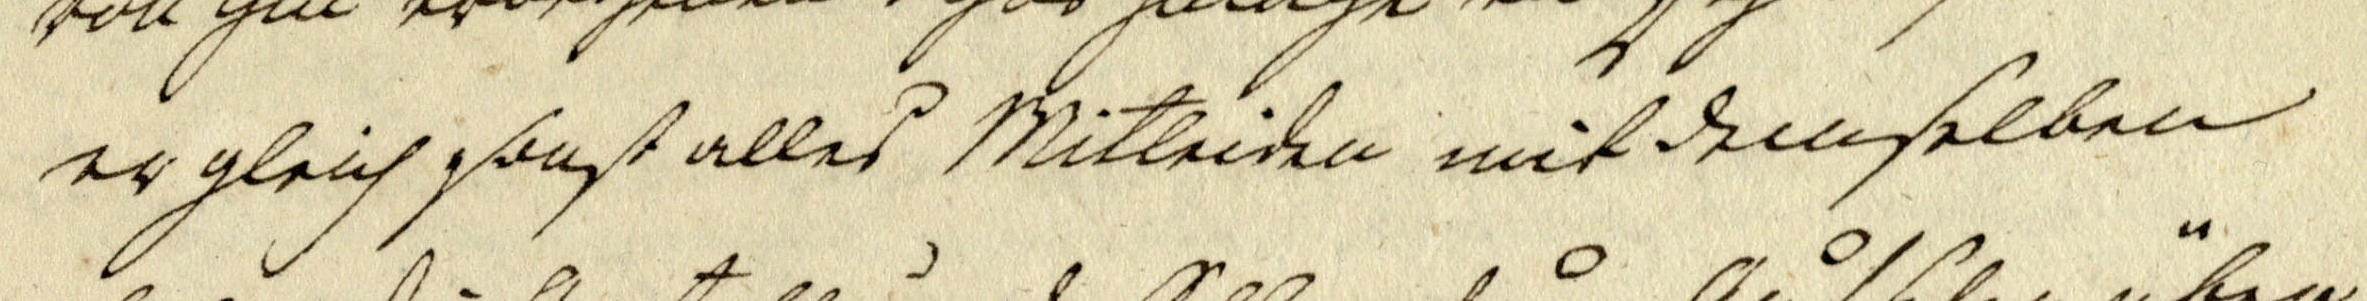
er gleich sonst alles Mitleiden mit demselben
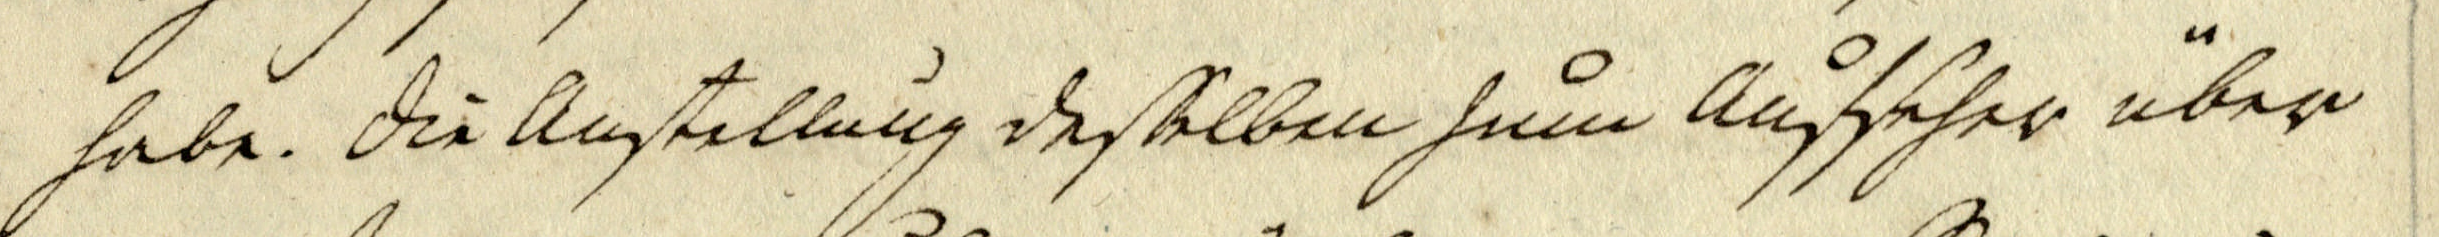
habe. Die Anstellung desselben zum Aufseher über
